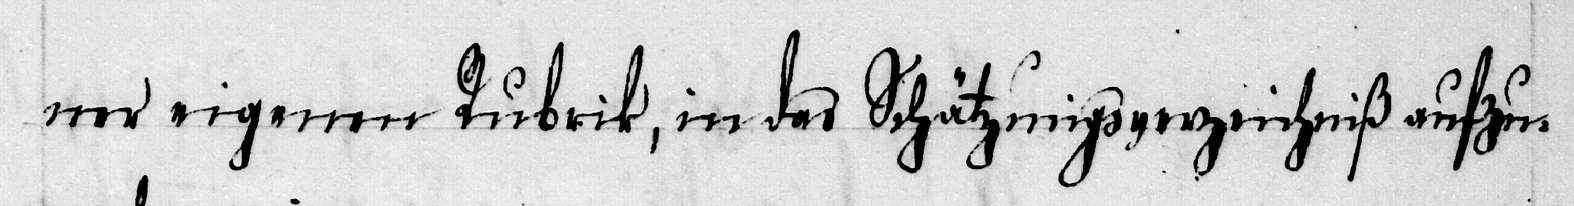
ner eigenen Rubrik, in das Schätzungsverzeichniß aufzu¬
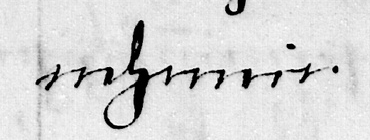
nehmen.
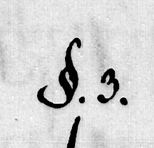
§. 3.
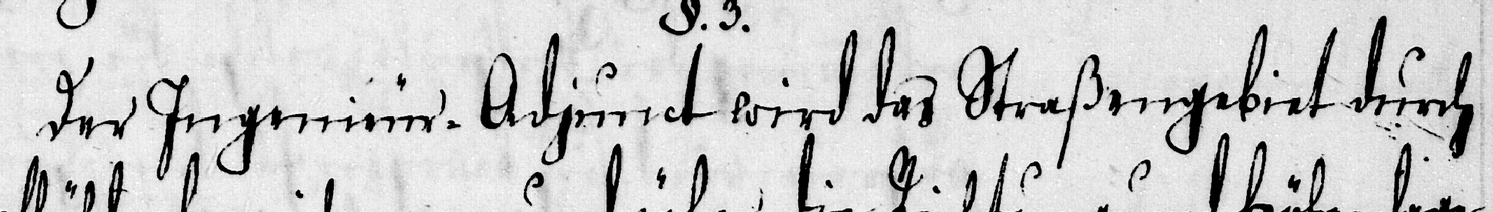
Der Ingenieur-Adjunct wird das Straßengebiet durch
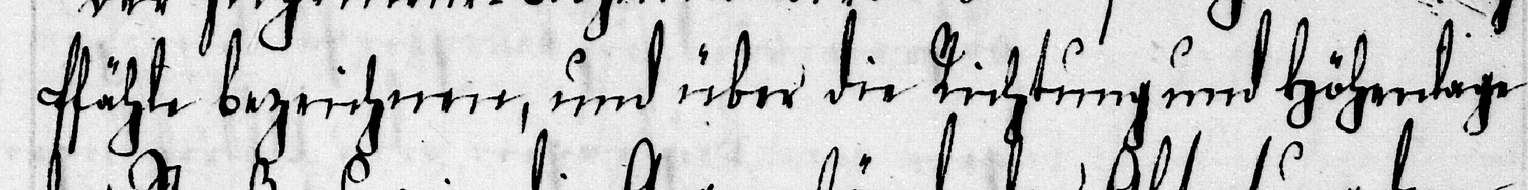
Pfähle bezeichnen, und über die Richtung und Höhenlage
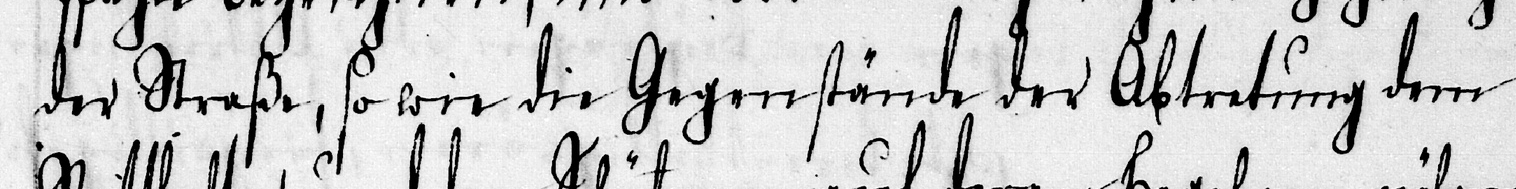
der Straße, sowie die Gegenstände der Abtretung dem
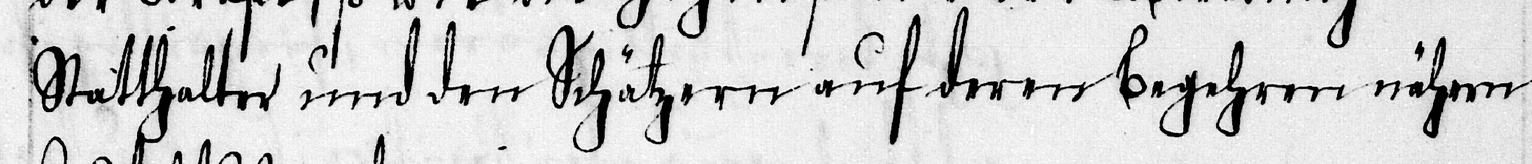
Statthalter und den Schätzern auf deren Begehren nähern
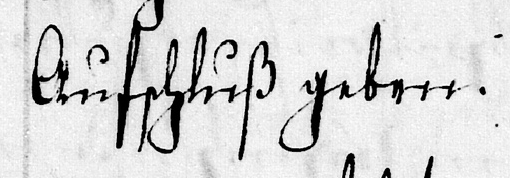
Aufschluß geben.
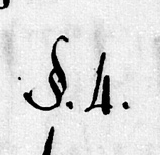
§. 4.
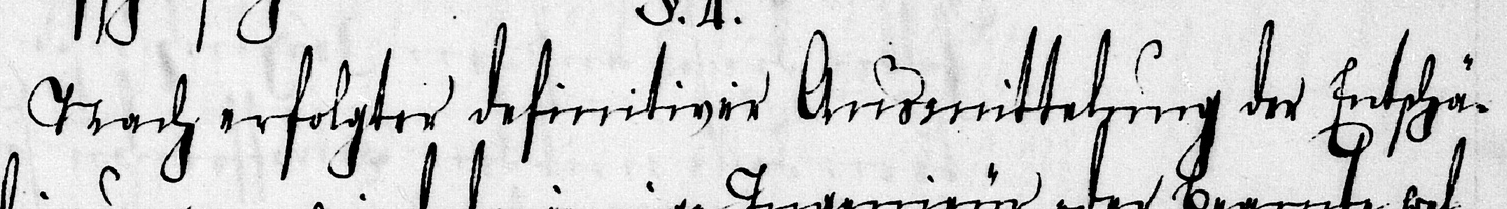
Nach erfolgter definitiver Ausmittelung der Entschä¬
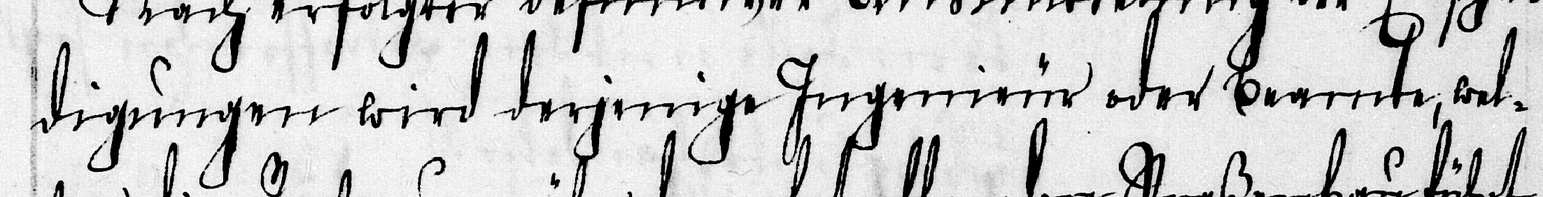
digungen wird derjenige Ingenieur oder Beamte, wel¬
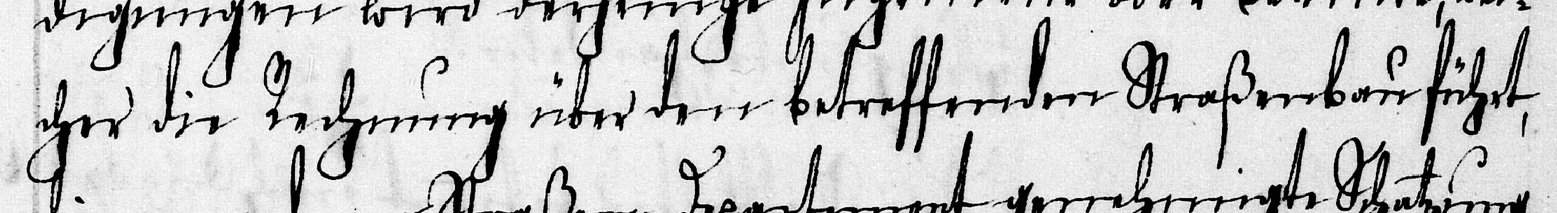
cher die Rechnung über den betreffenden Straßenbau führt,
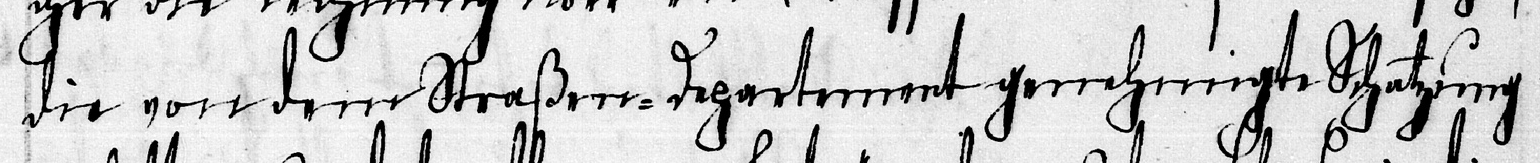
die von dem Straßen-Departement genehmigte Schatzung
